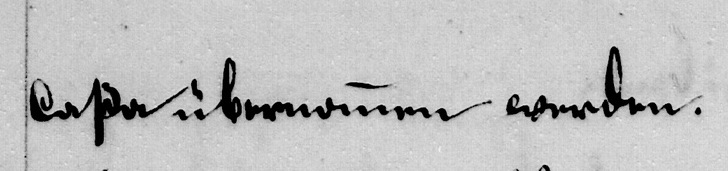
caßa übernommen werden.
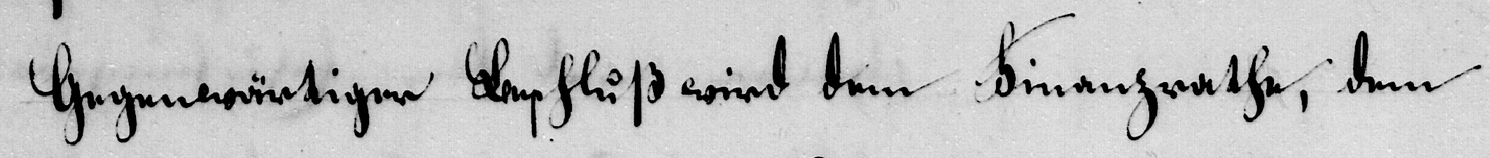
Gegenwärtiger Beschluß wird dem Finanzrathe, dem
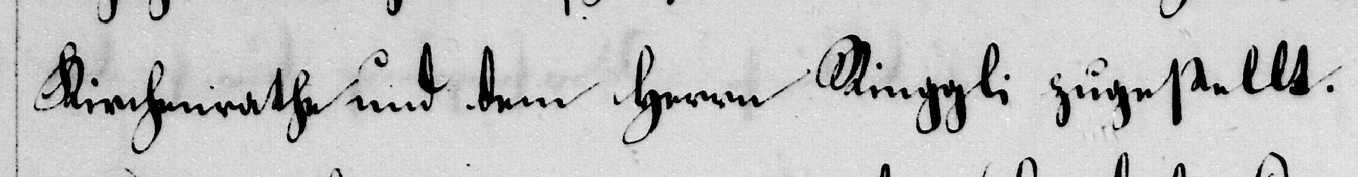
Kirchenrathe und dem Herrn Ringgli zugestellt.
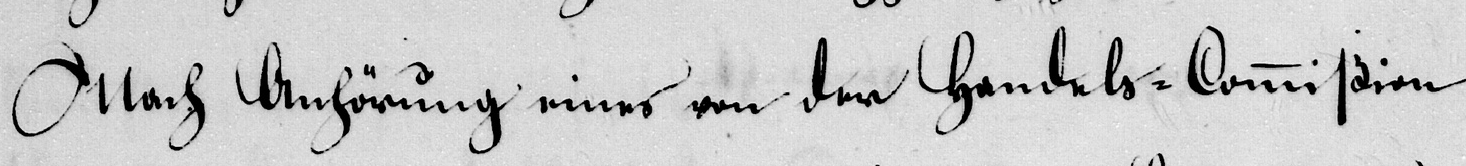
Nach Anhörung eines von der Handels-Commißion
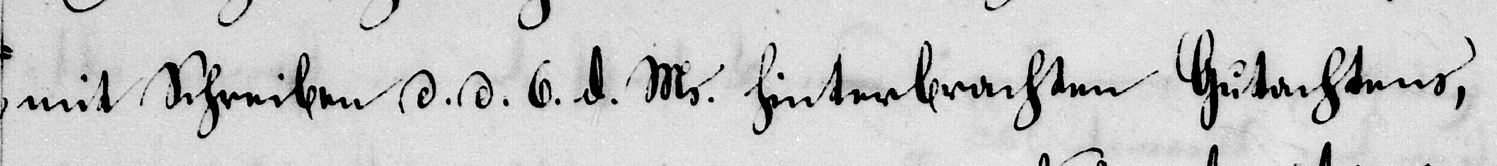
mit Schreiben d. d. 6. d. Ms. hinterbrachten Gutachtens,
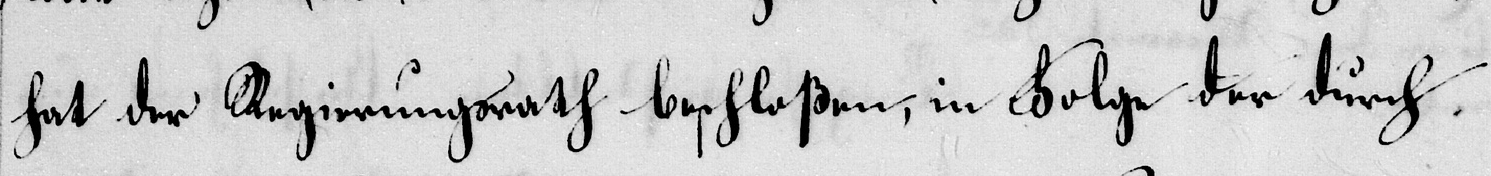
hat der Regierungsrath beschloßen, in Folge der durch
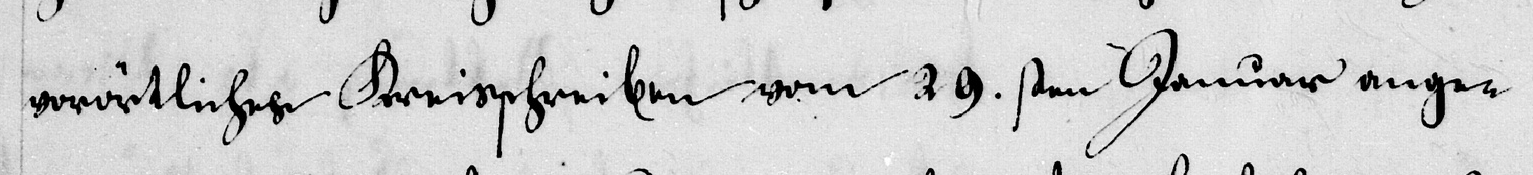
vorörtliches Kreisschreiben vom 29.sten Januar ange¬
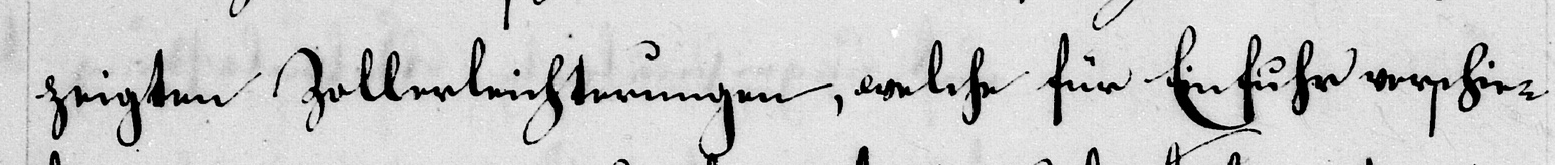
zeigten Zollerleichterungen, welche für Einfuhr verschie¬
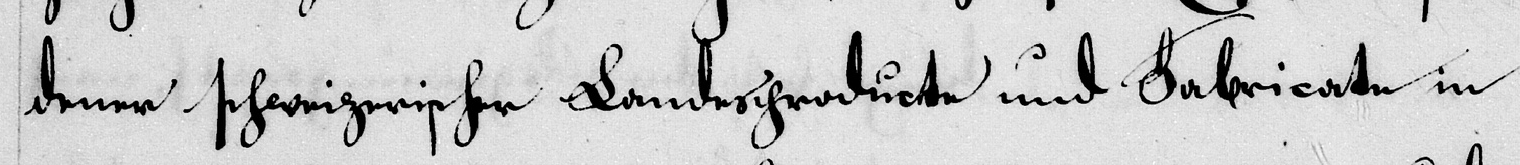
dener schweizerischer Landesproducte und Fabricate in
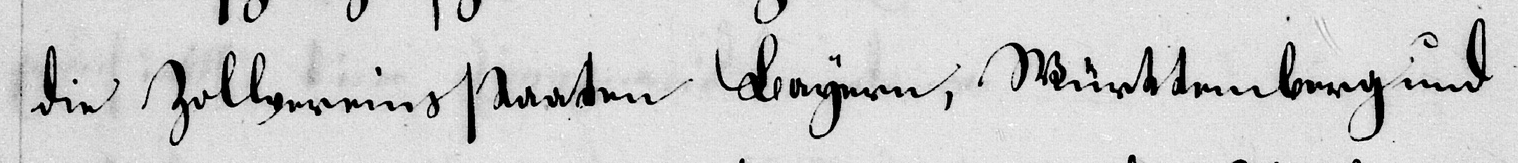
die Zollvereinsstaaten Bayern, Württemberg und
